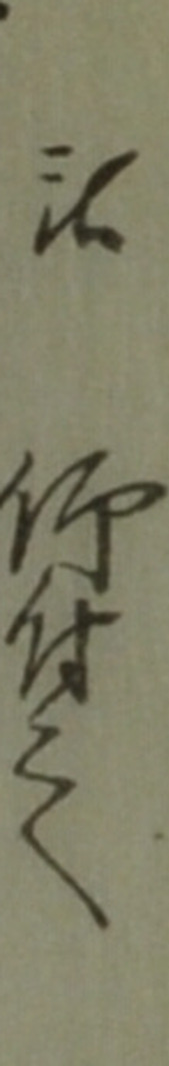被仰付之
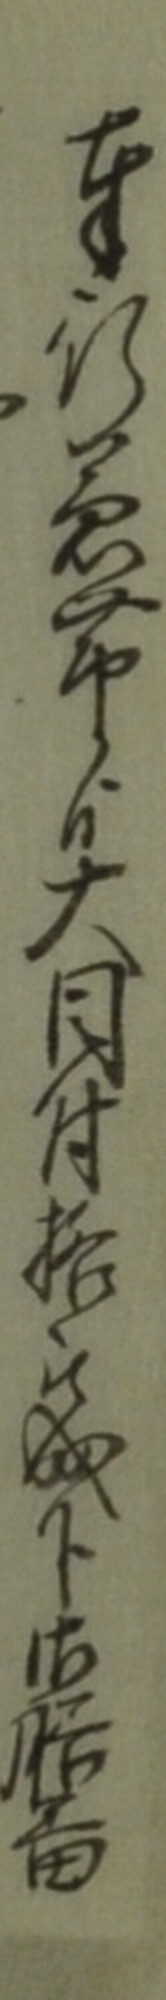奉行兼帯ゟ大目付格被成下御膳番
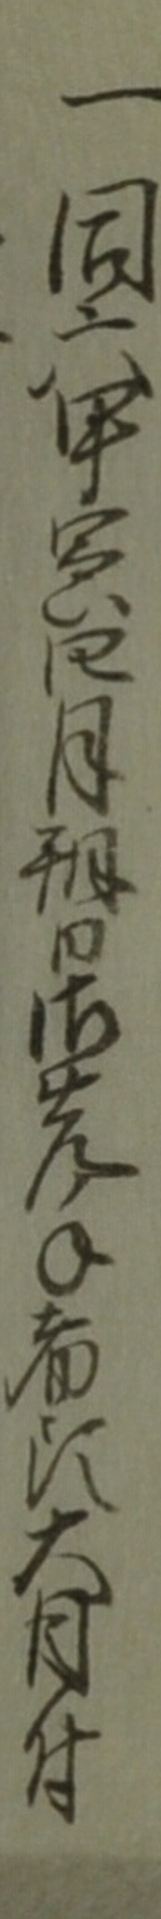一同六甲寅四月朔日御先手者頭大目付
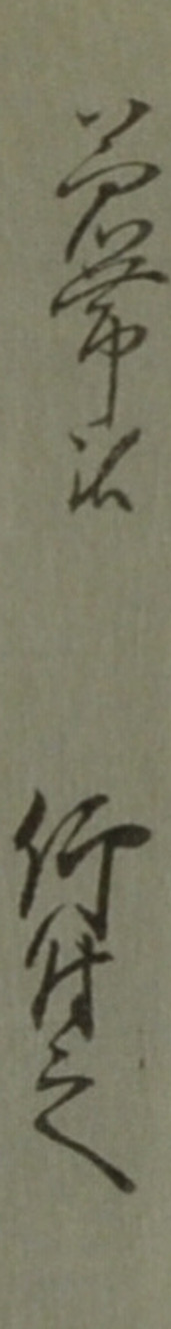兼帯被仰付之
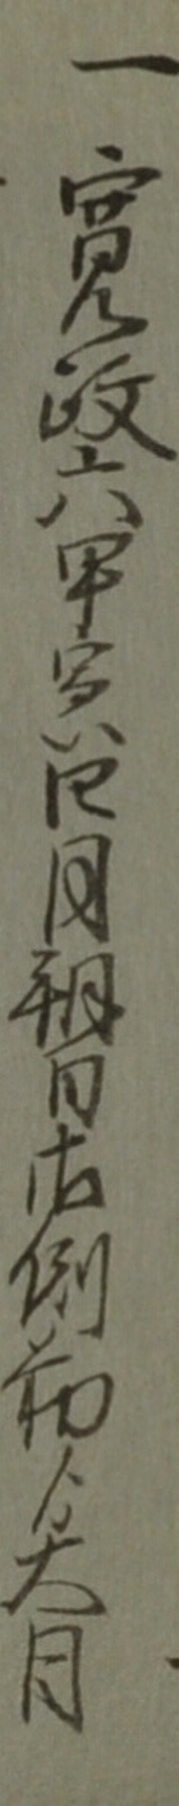一寛政六甲寅四月朔日御側勤ゟ大目
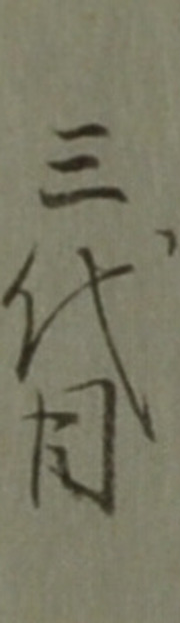三代目
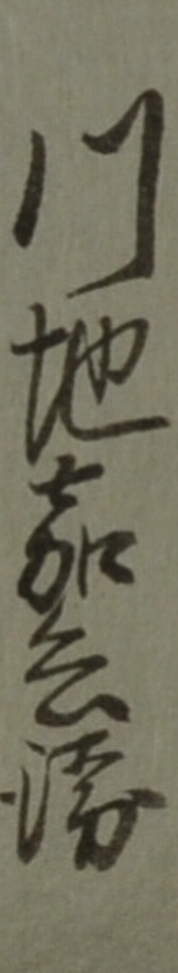川地嘉兵衛
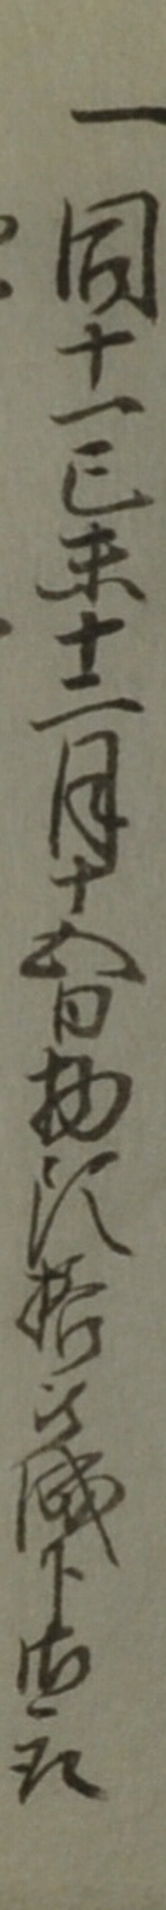一同十一己未十二月十五日物頭格被成下御取
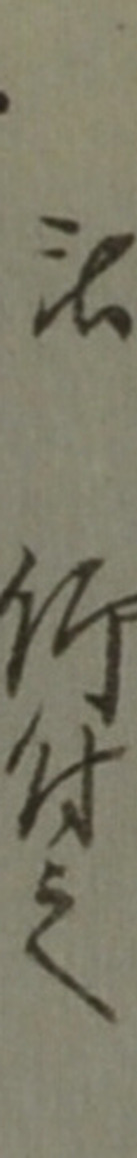被仰付之
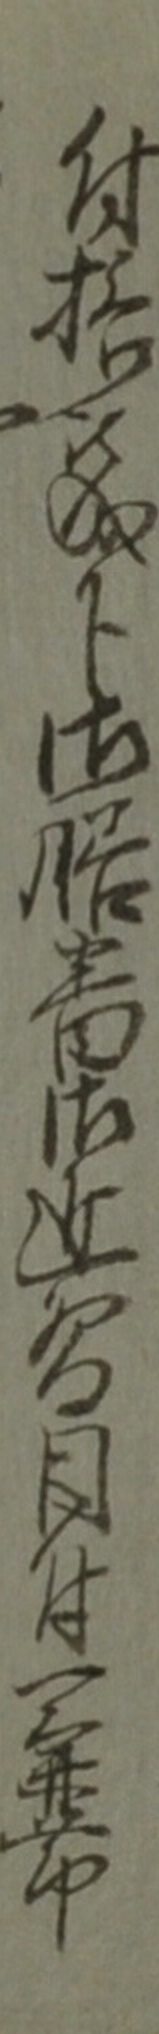付格被成下御膳番御近習目付兼帯
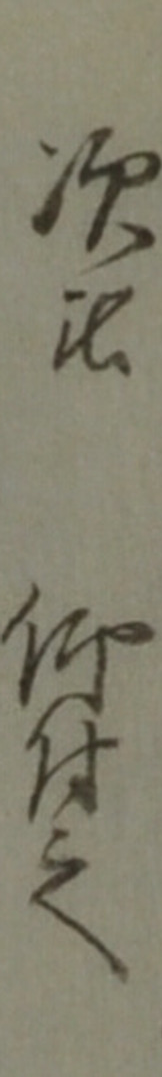次被仰付之
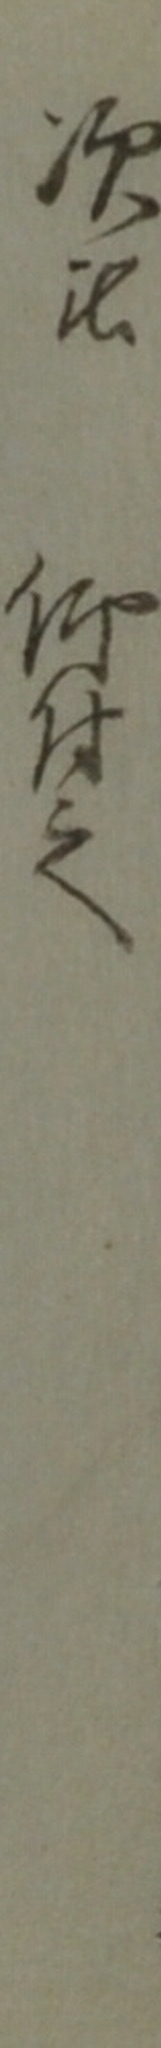次被仰付之
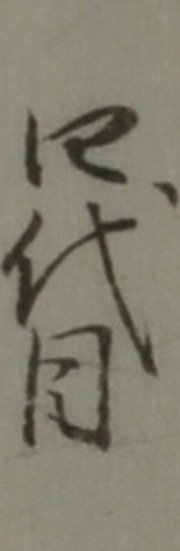四代目
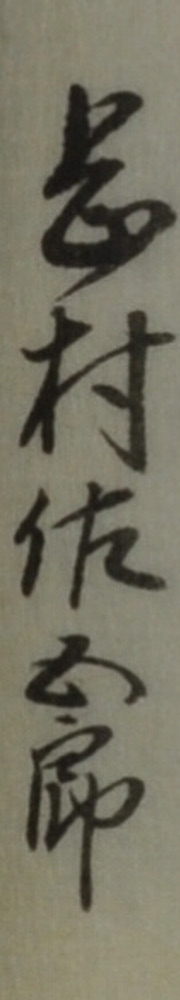岡村佐五郎
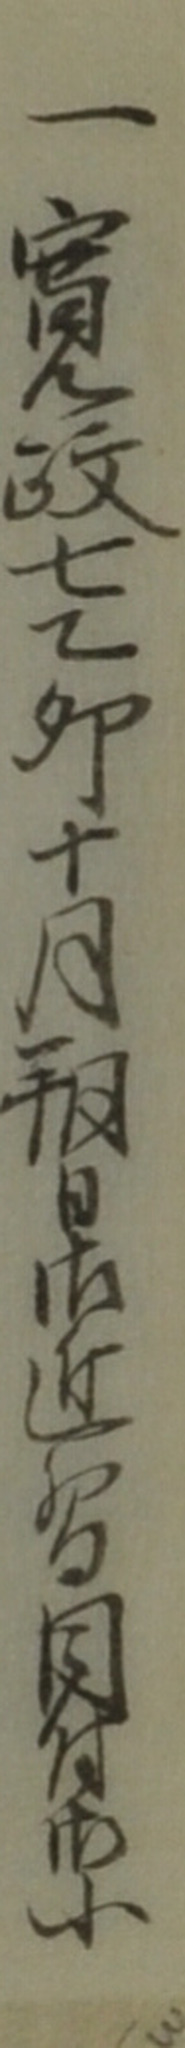一寛政七乙卯十月朔日御近習目付御小
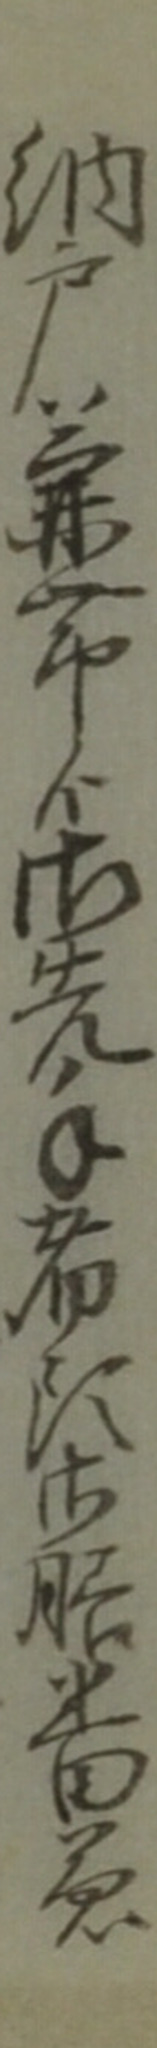納戸兼帯ゟ御先手者頭御膳番兼
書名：諸御役代々録（四）
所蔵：伊那市立高遠町図書館・合同会社AMANE
